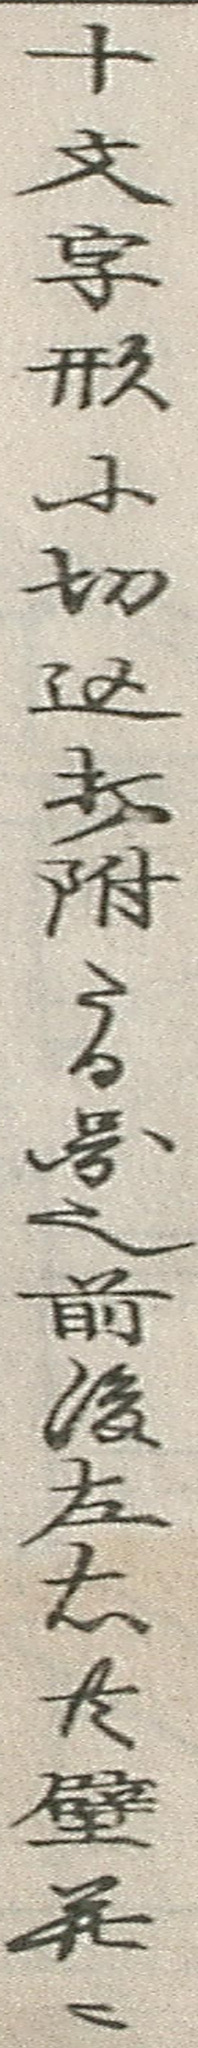十文字形に切込打附たる図之前後左右共壁并に
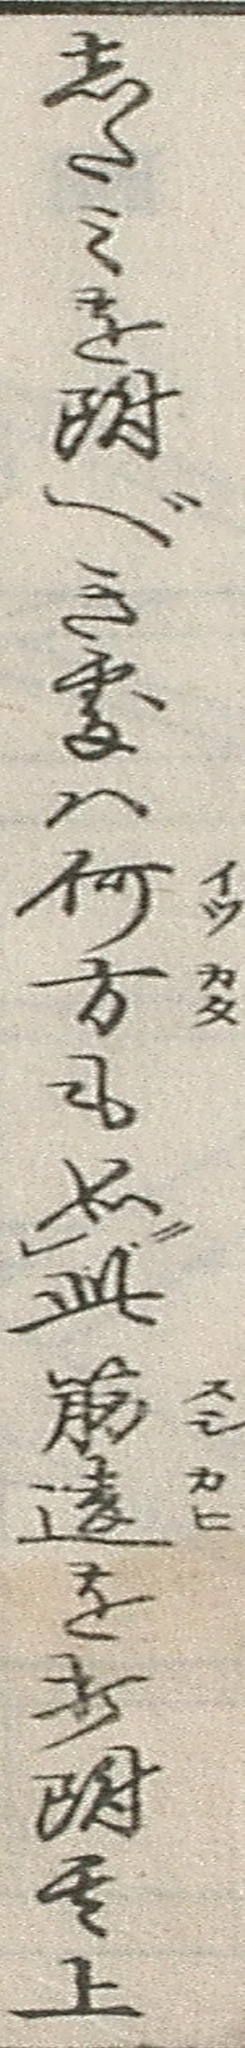したみを附べき処は何方も如此筋違を打附其上
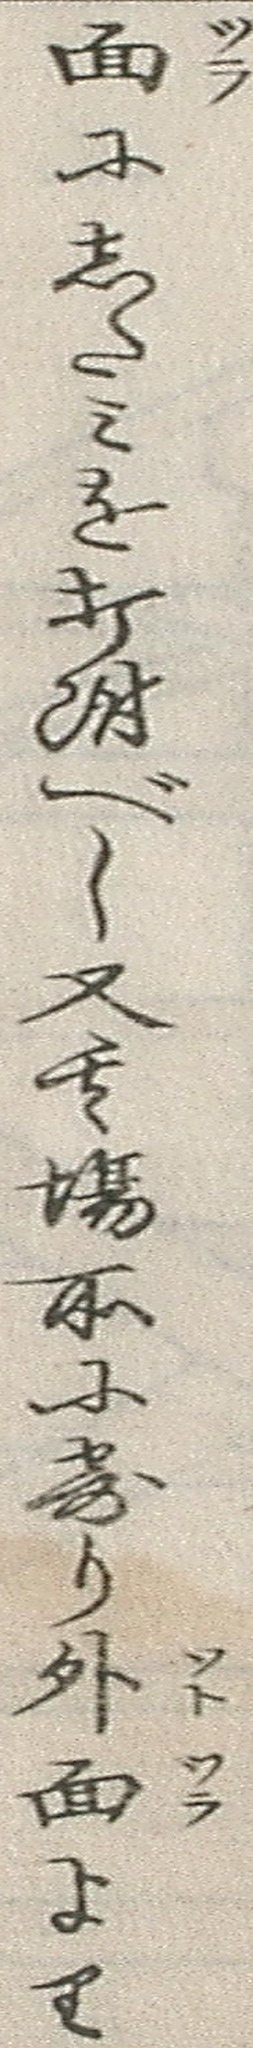面にしたみを打附べし又其場所に寄り外面より
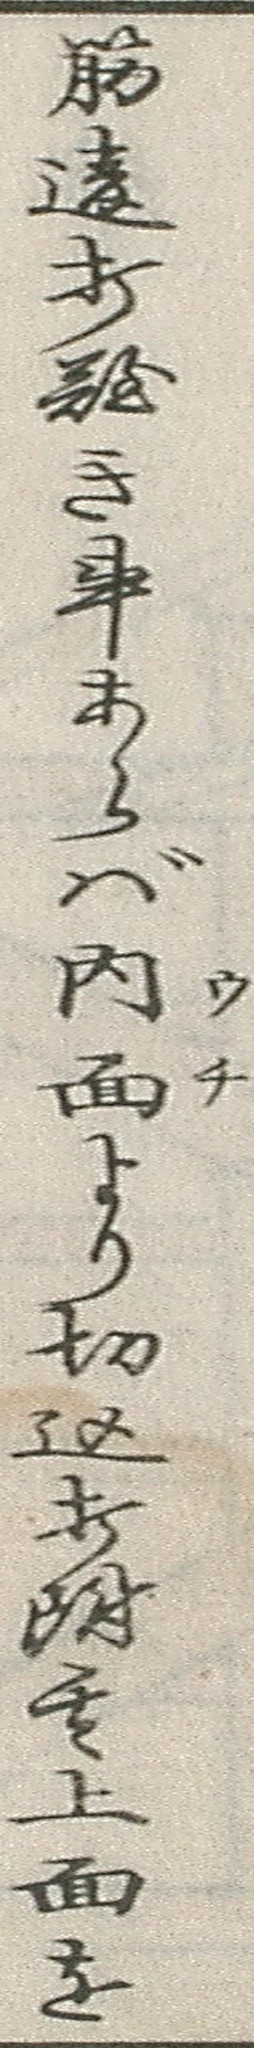筋違打難き事あらバ内面より切込打附其上面を
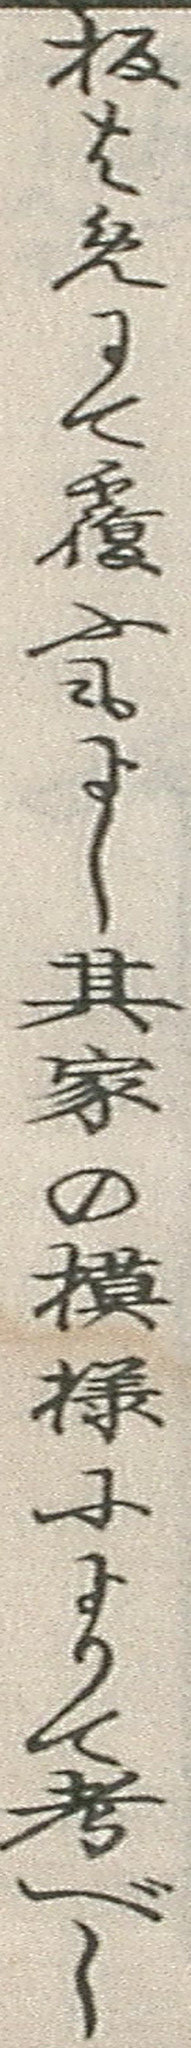板はめにて覆ふもよし其家の模様によりて考べし
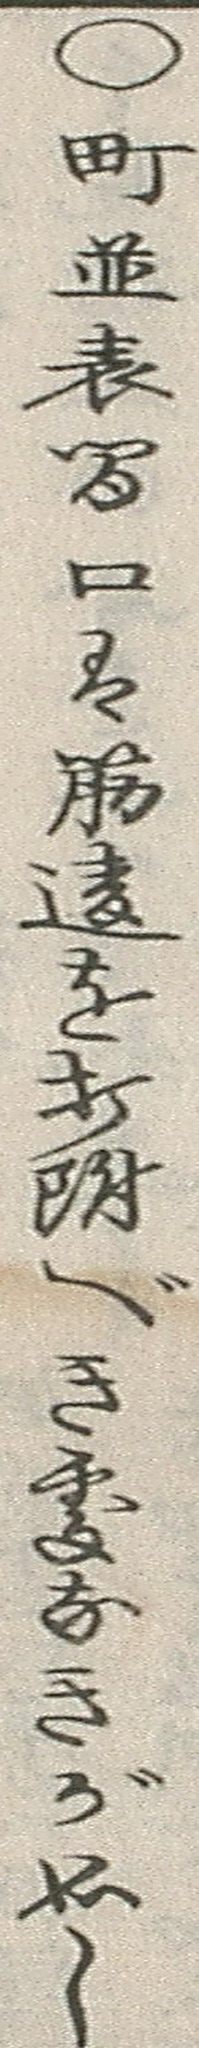〇町並表間口は筋違を内附べき処なきが如し
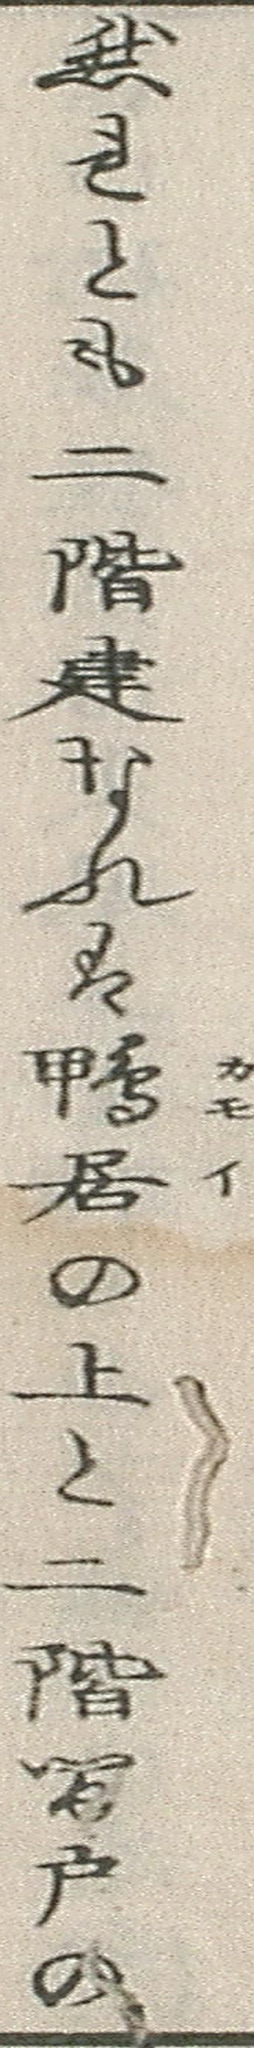然れとも二階建なれは鴨居の上と二階間戸の
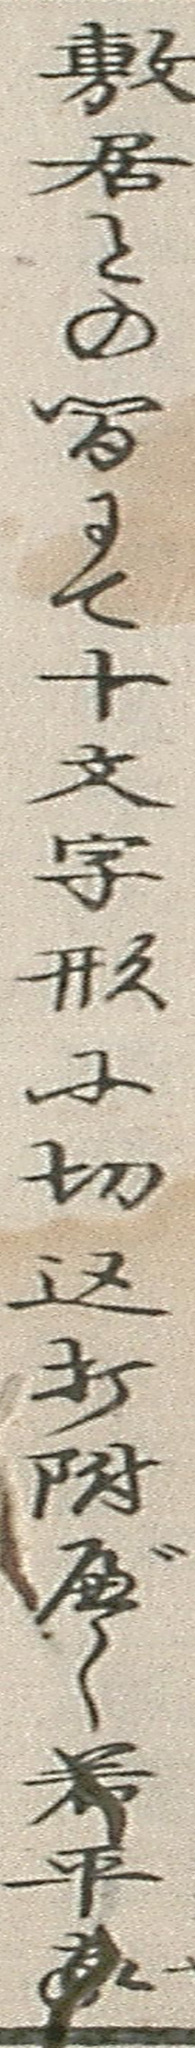敷居との間にて十文字形に切込打附べし若平家
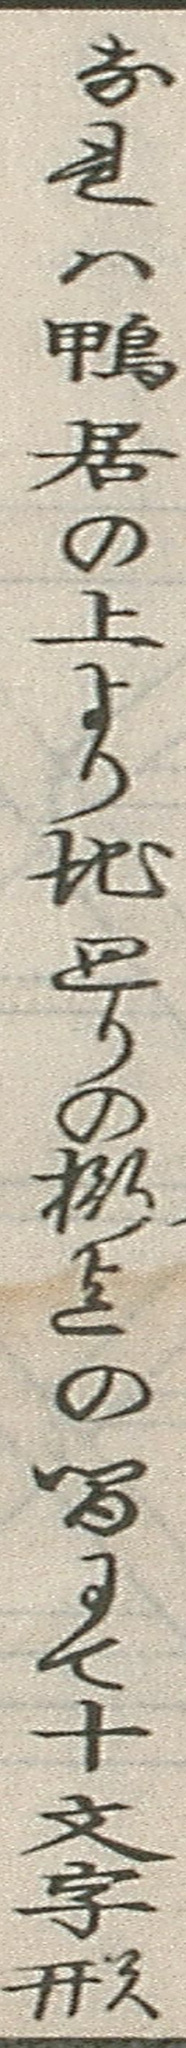なれは鴨居の上より地廻りの桁迄の間にて十文字形
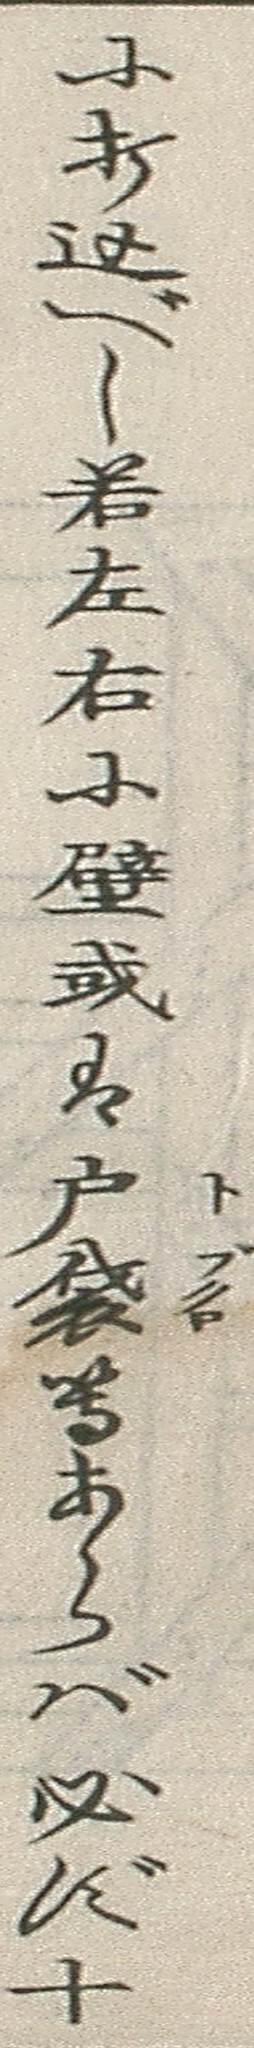に打込べし若左右に壁或は戸袋等あらば必ず十
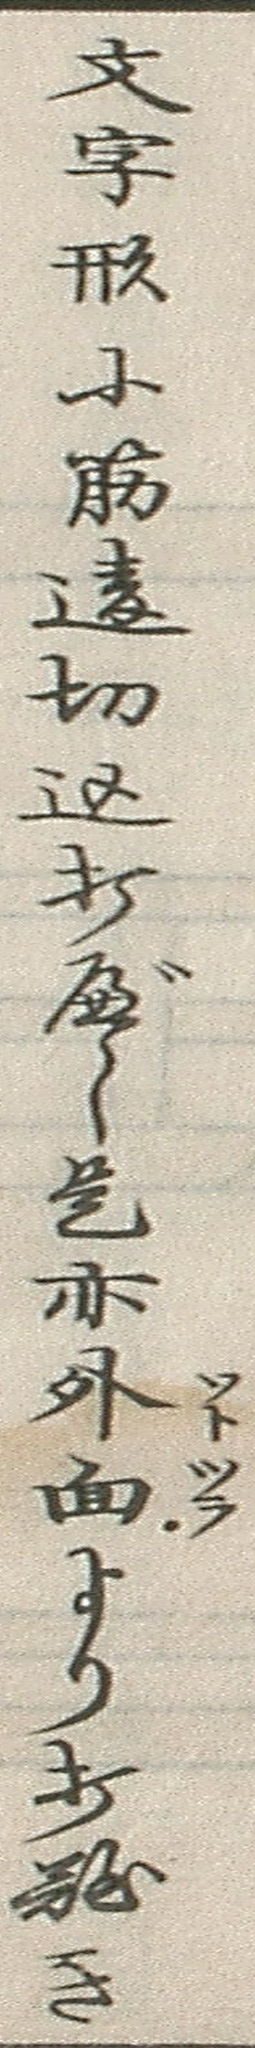文字形に筋違切込打べし是亦外面より打難き
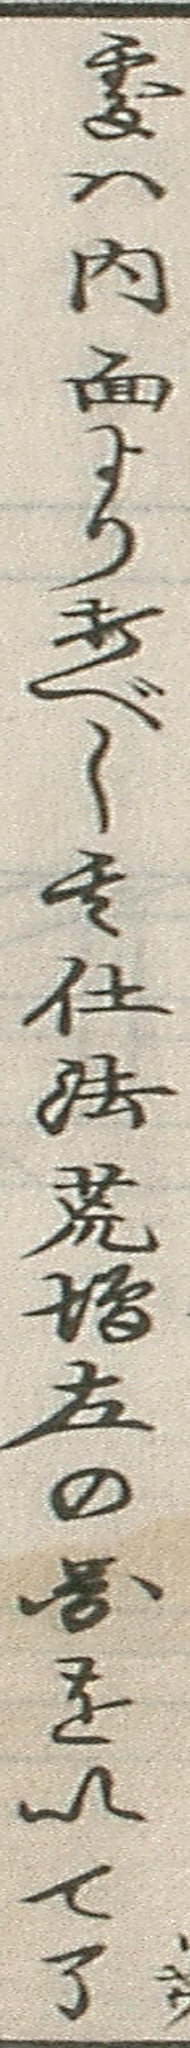処ハ内面より打べし其仕法荒増左の図を以て了
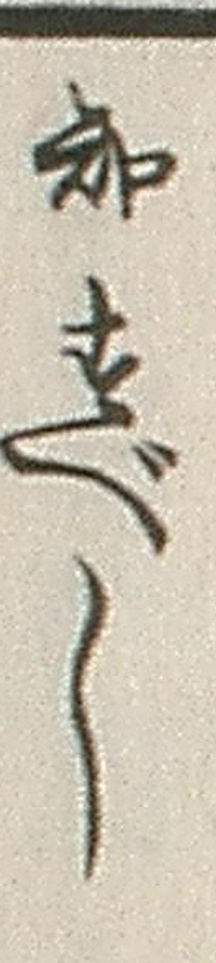知すべし
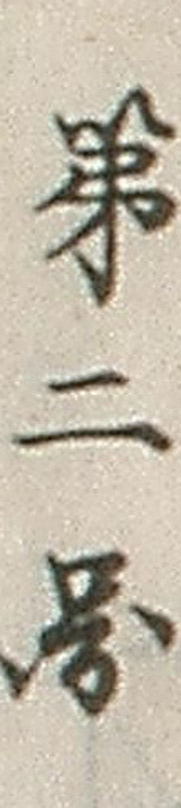第ニ図

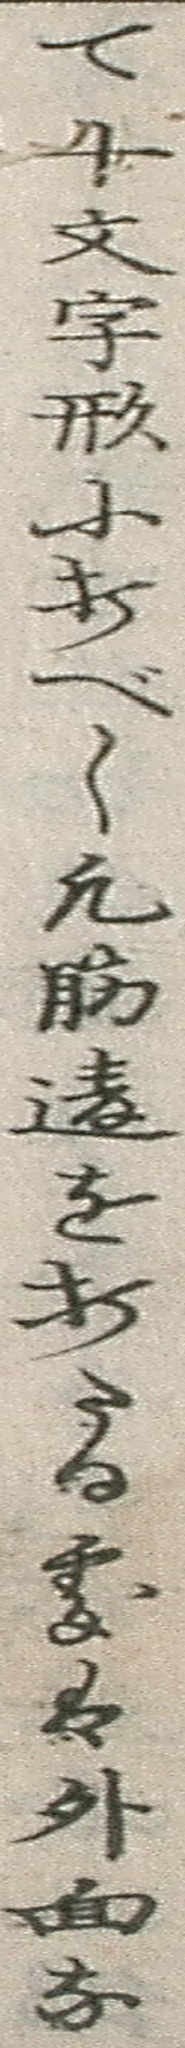て十文字形に打べし凡筋違を打たる処は外面な
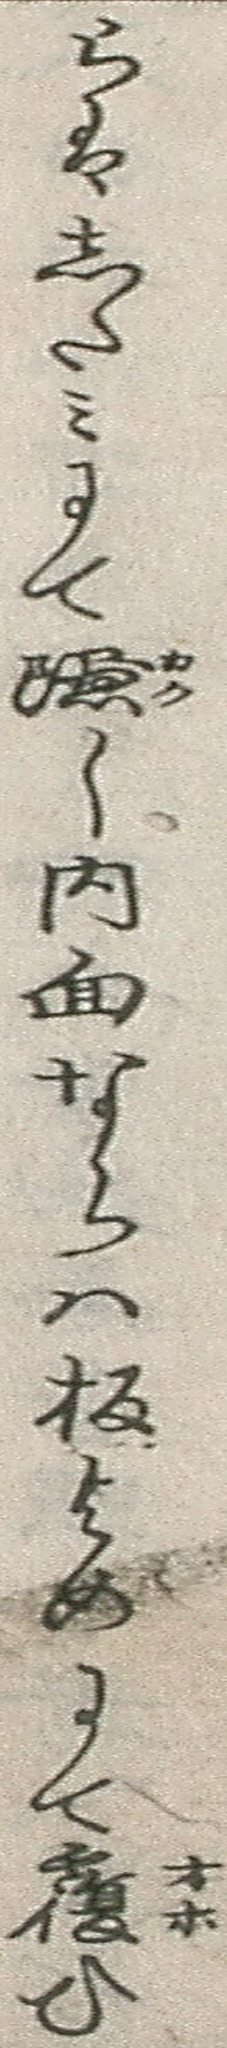らはしたみにて隠し内面ならは板とめにて覆ひ
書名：附録　地震劇風災害豫防法圖説（内題）
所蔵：東京大学地震研究所図書室 Earthquake Research Institute Library, The University of Tokyo, JAPAN
